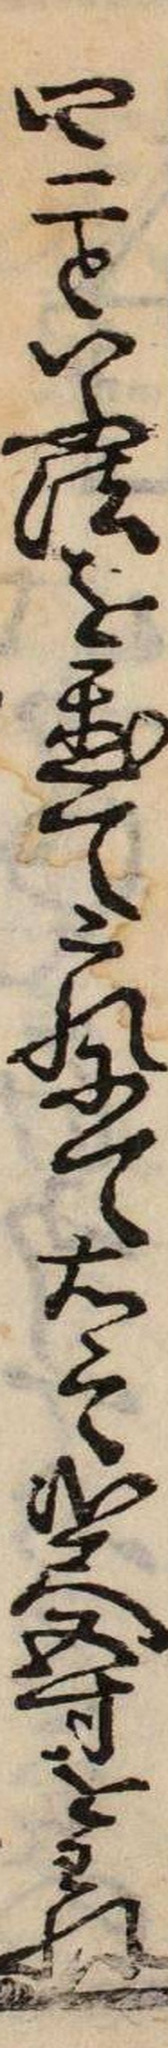四二といふ法を置てこれにて右之弐尺五寸をわれは
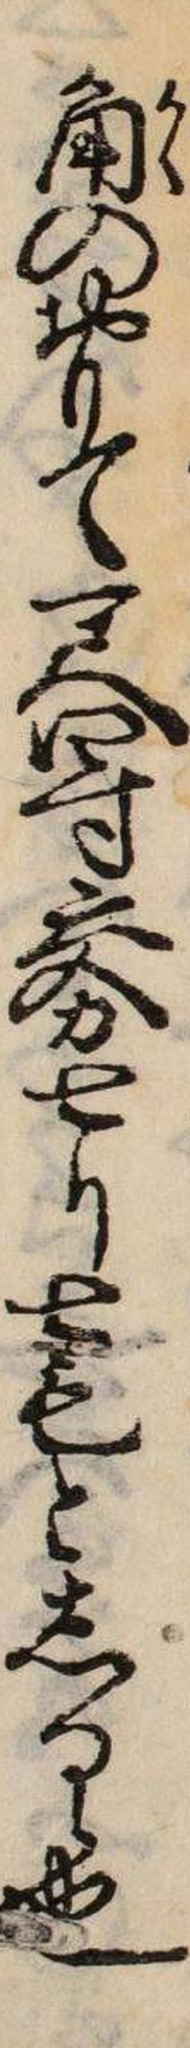角のおりて一尺四寸六分七り七毛としなゝ也
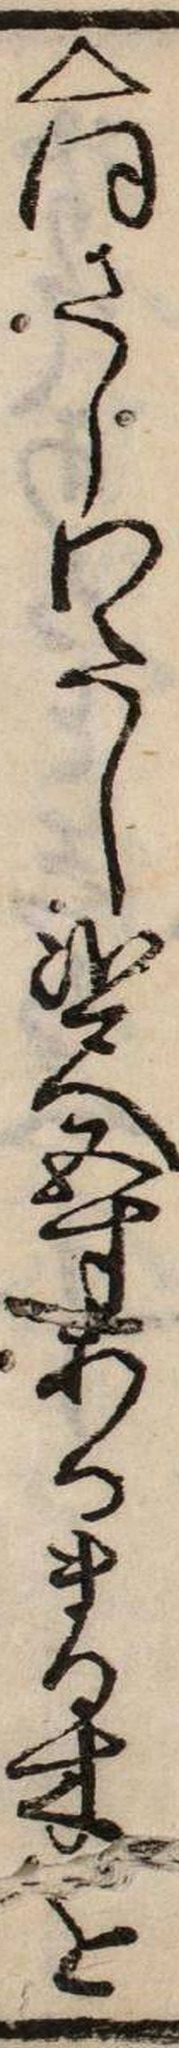△同さしわたし弐尺五寸あるまる木を
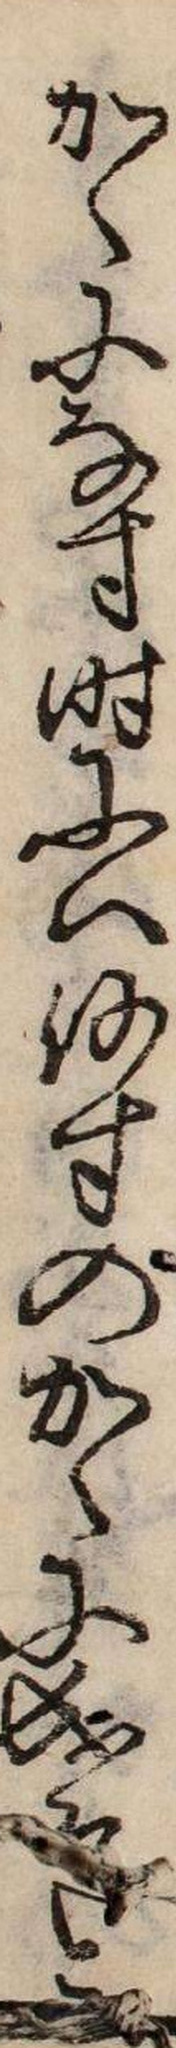かくになす時には何寸のかくに成そと
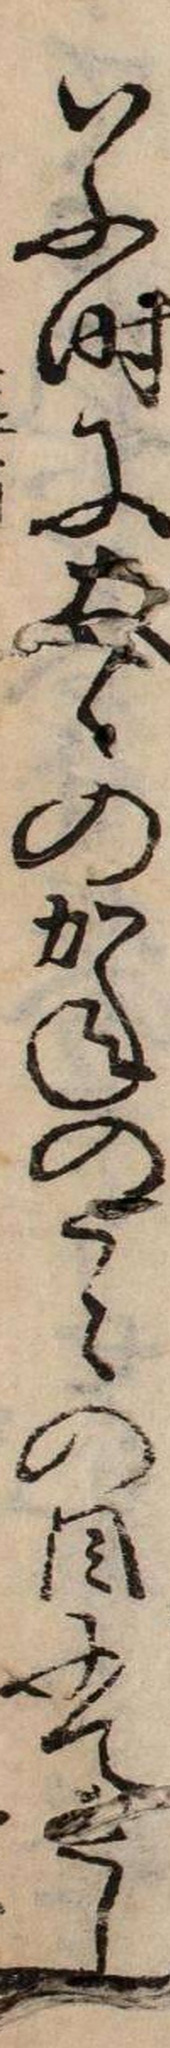いふ時に大くのかねのうらの目にてさし

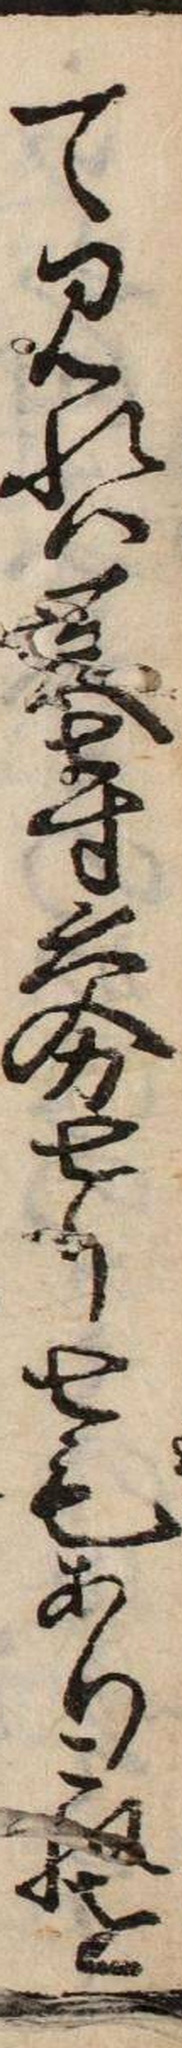て見れは一尺七寸六分七り七毛あるこれを
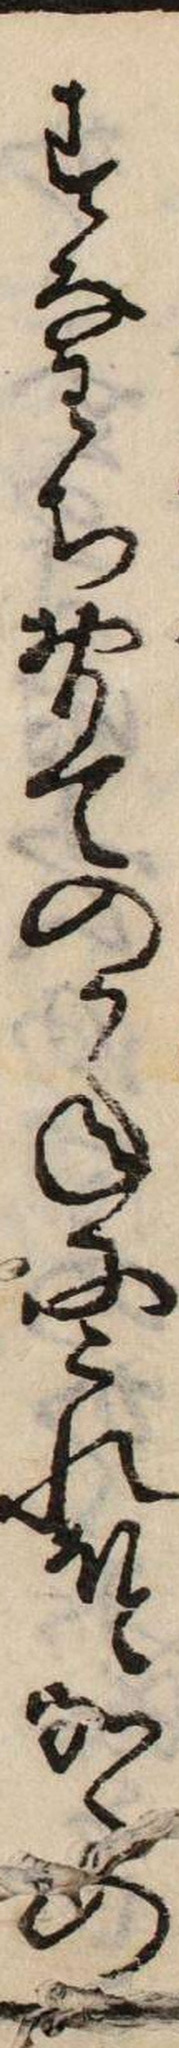すなわちおりてのかねにこれほとかくの
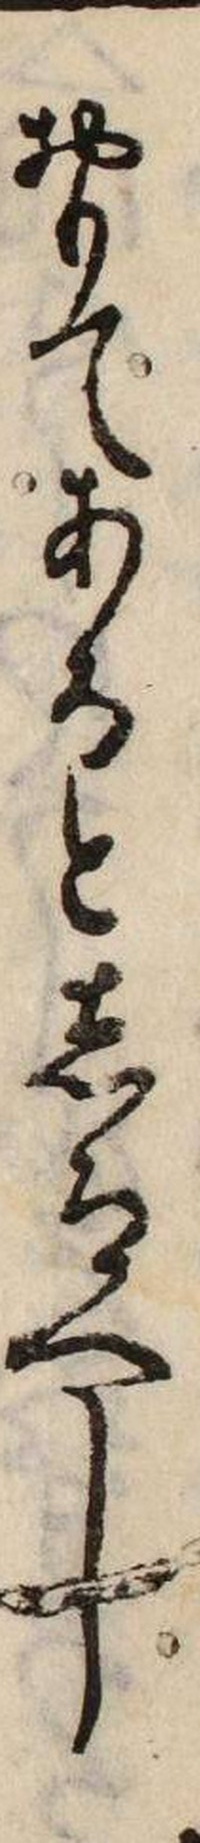おりてあるとしるへし
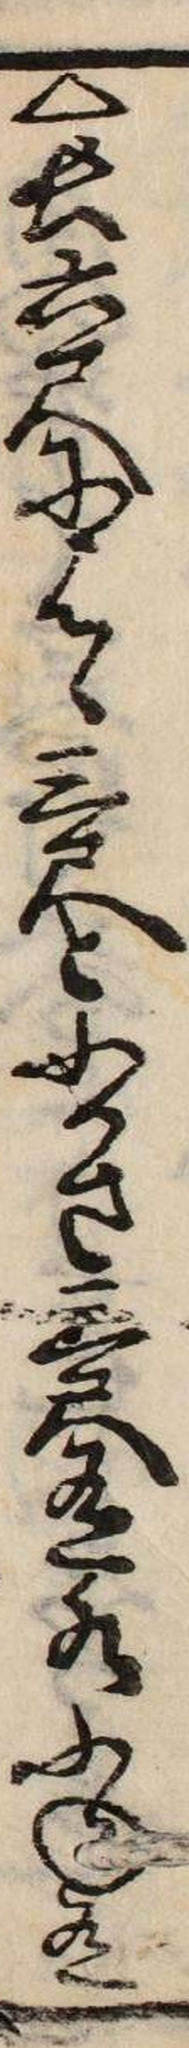△長六尺にはゝ三尺とふかさ三尺有水ふね有
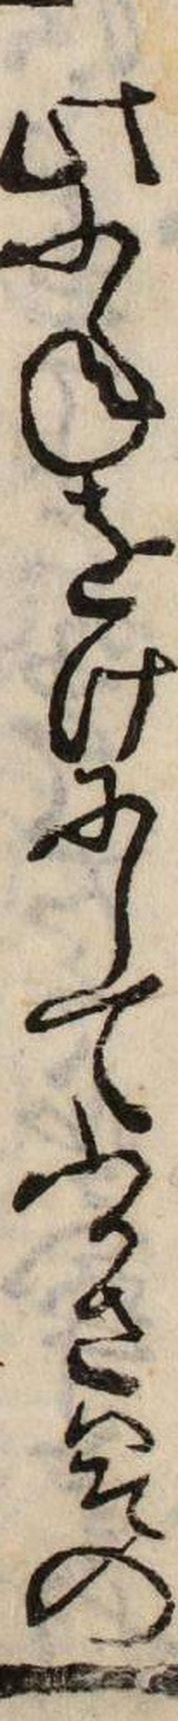此ふねをけにしてふかさはその
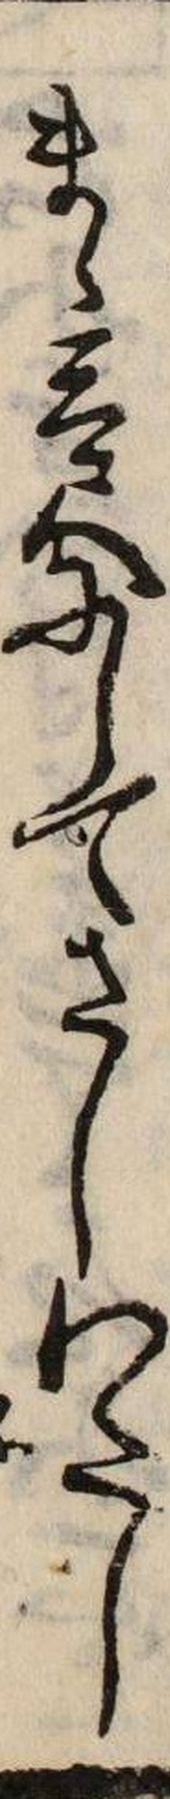まゝ三尺にしてさしわたし
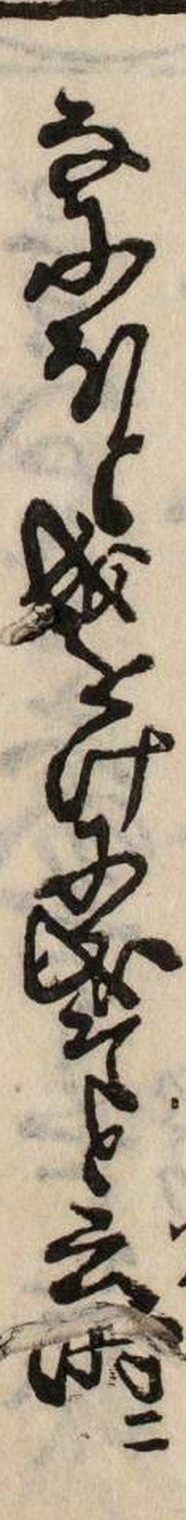なにほと成をけに成そと云時に
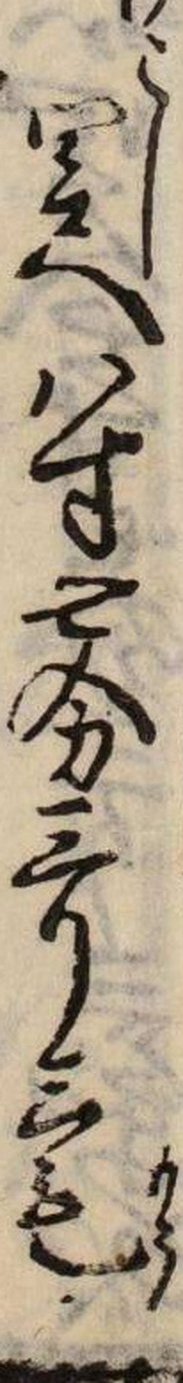四尺八寸七分三り三毛
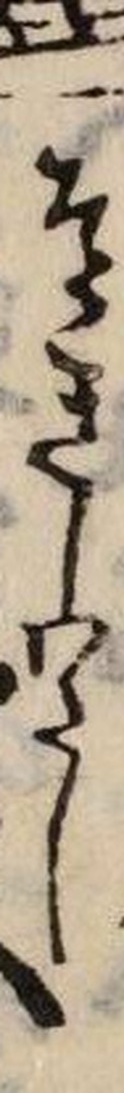そこさしわたし
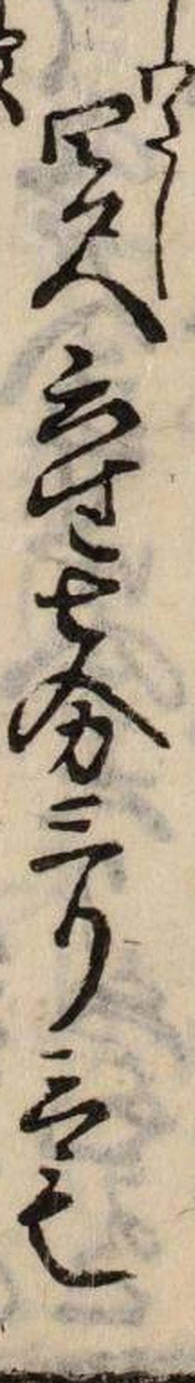四尺六寸七分三り三毛
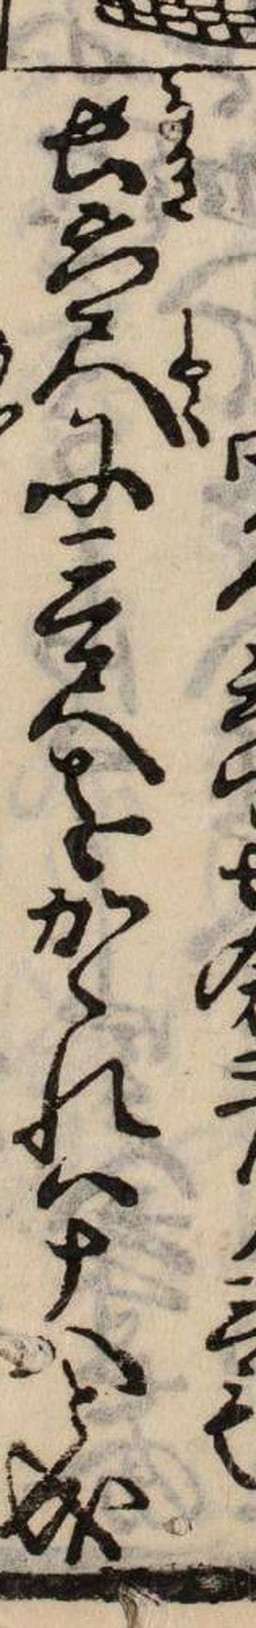長六尺に三尺をかけれハ十八と成
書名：塵劫記（寛永11年自跋、京都府立京都学・歴彩館追貴8）
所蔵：京都府立京都学・歴彩館 国文学研究資料館
